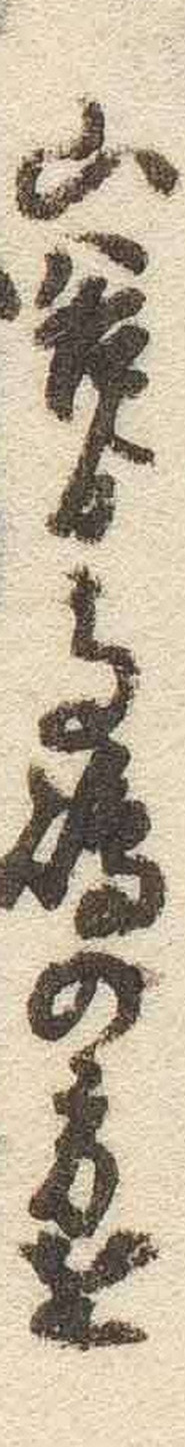山谷ゟ寺島の方を
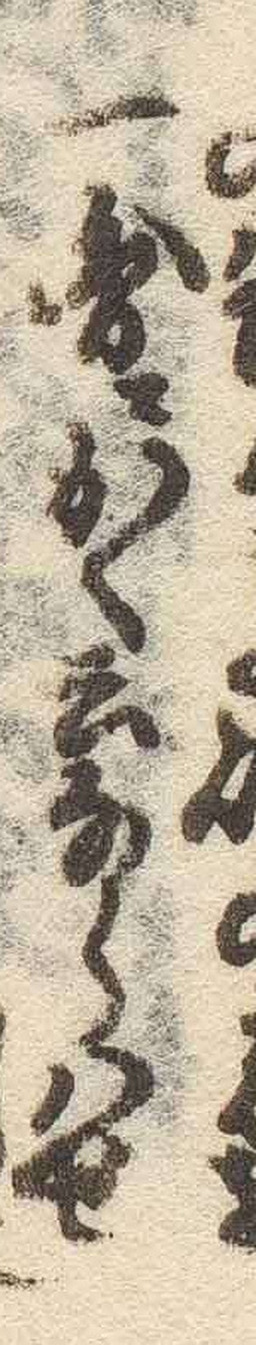一円にかく云ならはせし也
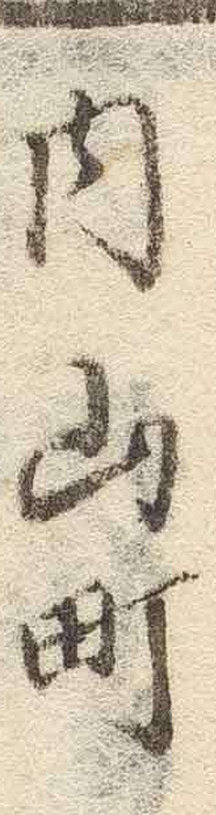内山町
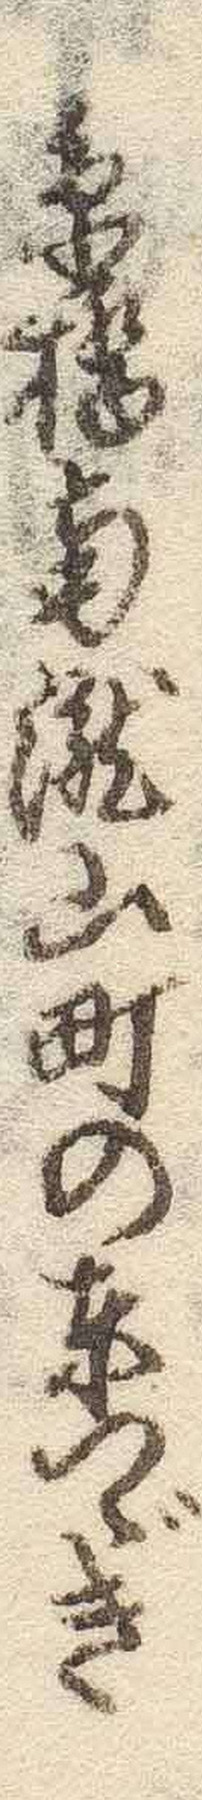京橋南瀧山町の東つゞき
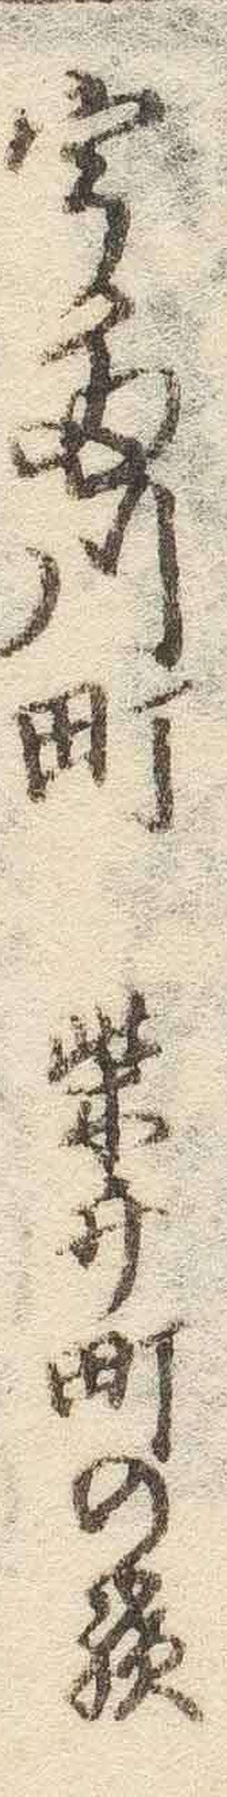宇多川町柴井町の続
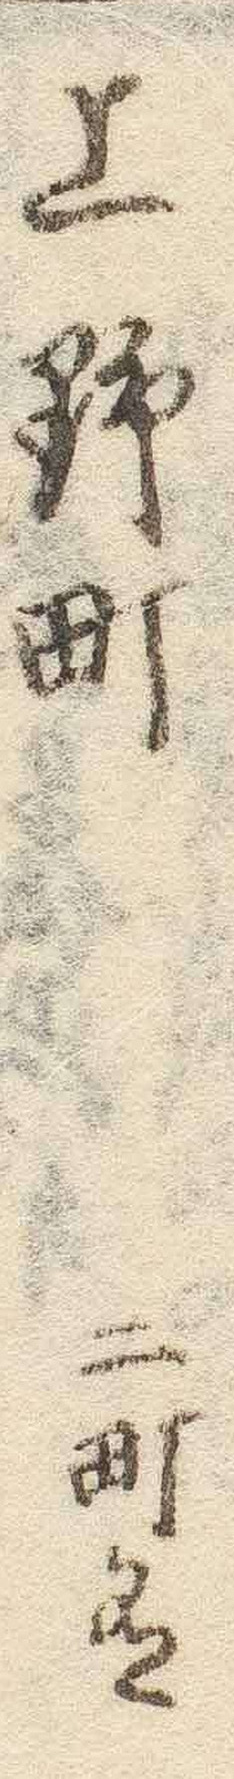上野町二町有
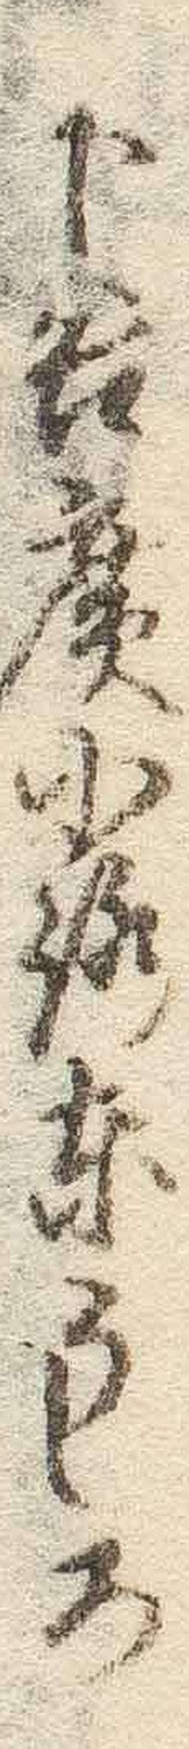下谷広小路ノ東うしろ
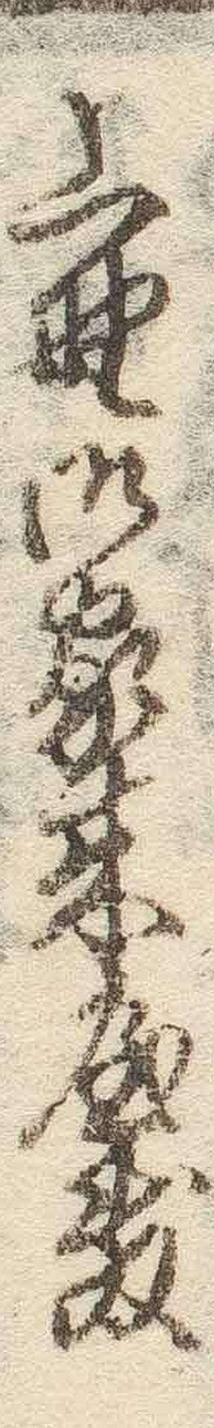上野御家来屋敷
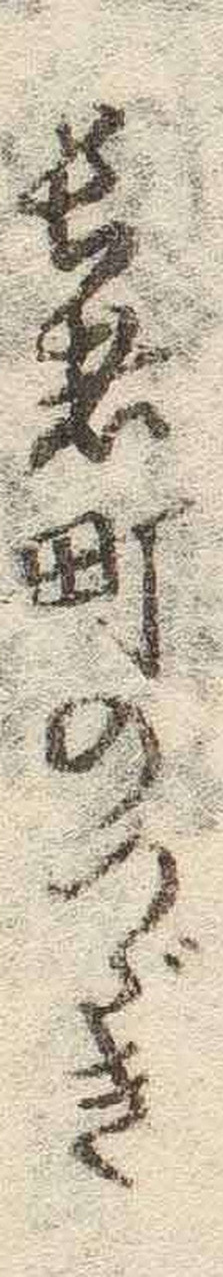長者町のつゞき
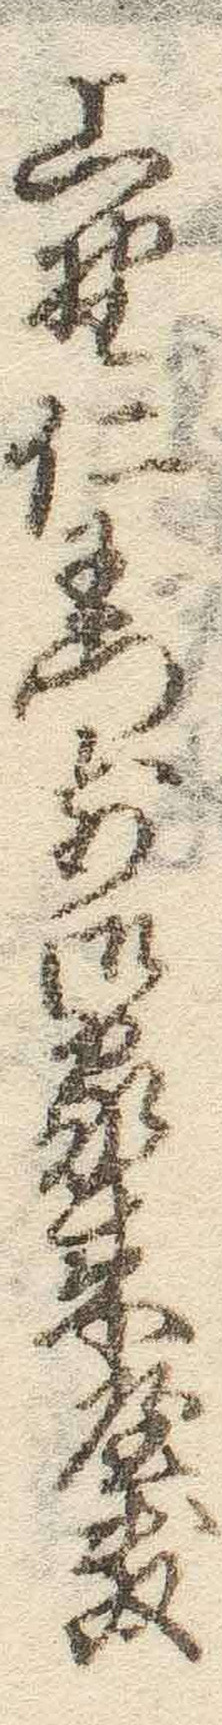上野仁王門前御家来屋敷
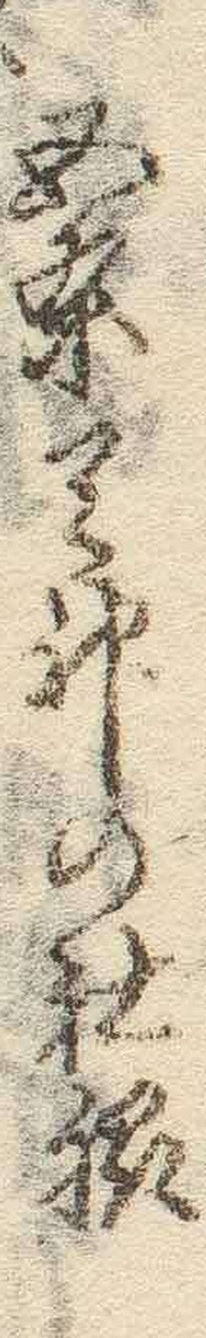五条天神の社脇
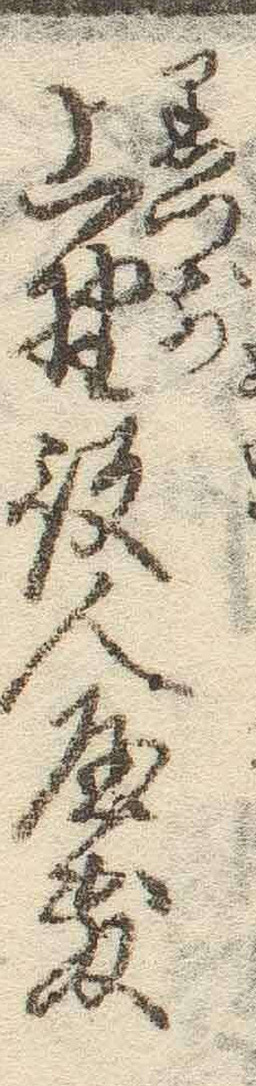上野役人屋敷
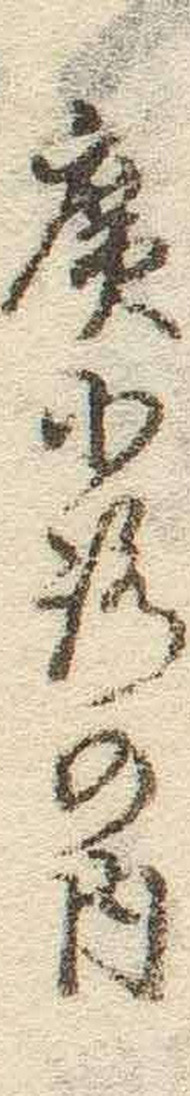広小路の内
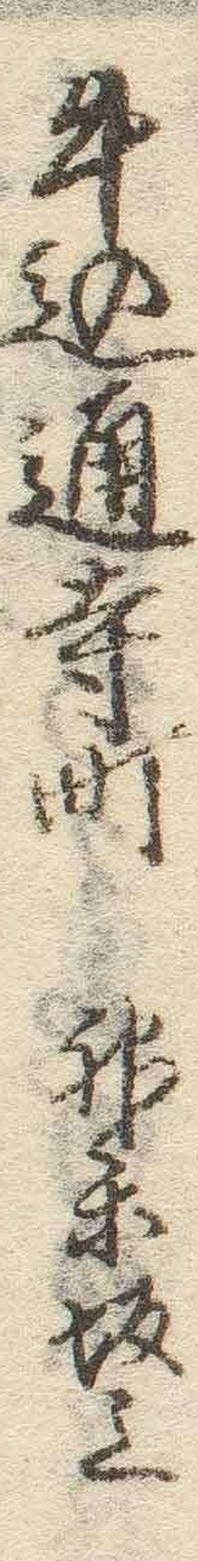牛込通寺町神楽坂上
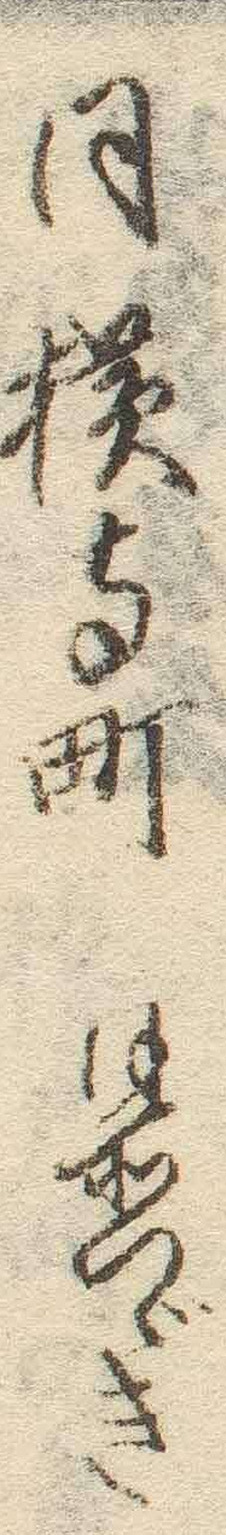同横寺町同所つゞき
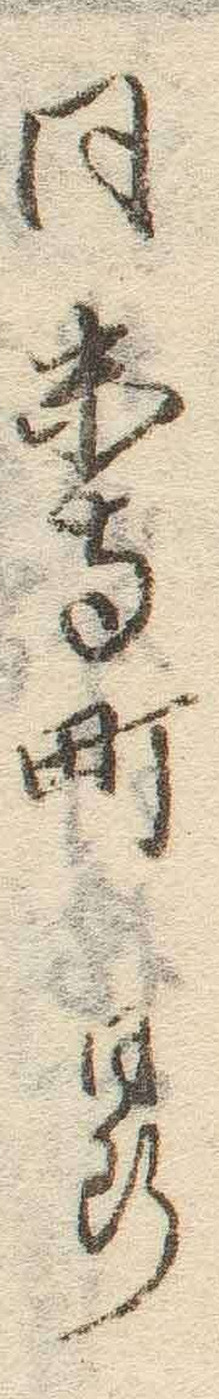同末寺町同断
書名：江戸町独案内
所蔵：東京学芸大学附属図書館 国文学研究資料館
